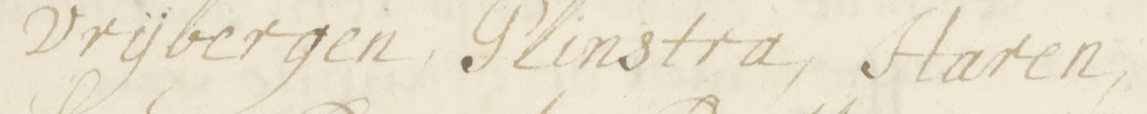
Vrijbergen, Plinstra, Haren,
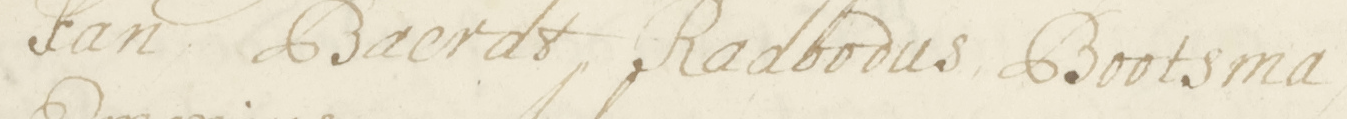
kan Baerdt, Radbodus, Bootsma
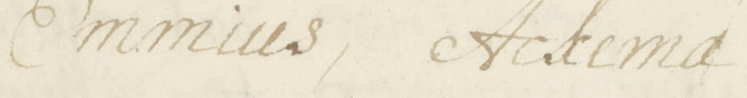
Ommius, Ackema
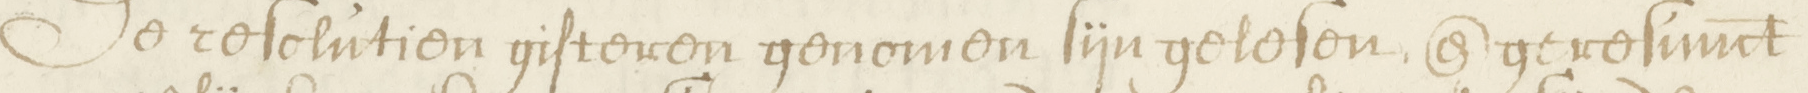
De resolutien gisteren genomen sijn gelesen, & geresumt
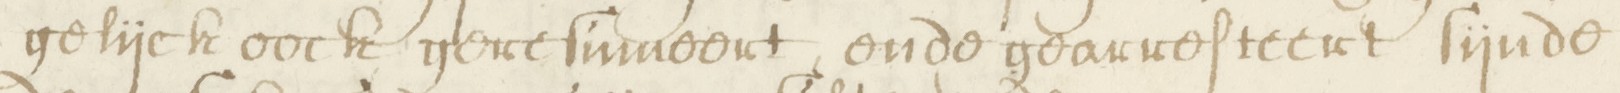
gelijck oock geresumeert, ende gearresteert sijn de
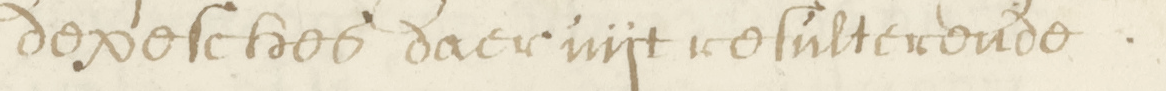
depesches daer uijt resulterende
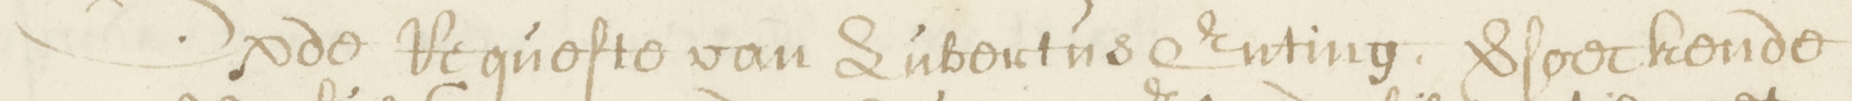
Opde Requeste van Lubertus Enting, vsoeckende
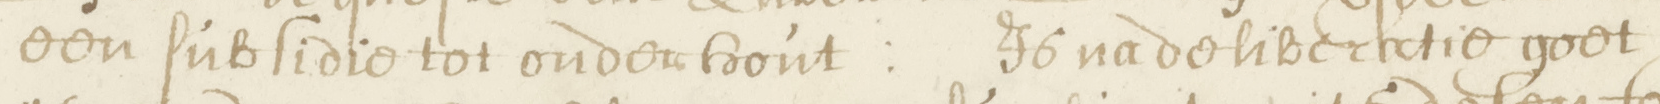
een subsidie tot onderhout: is na deliberatie goet
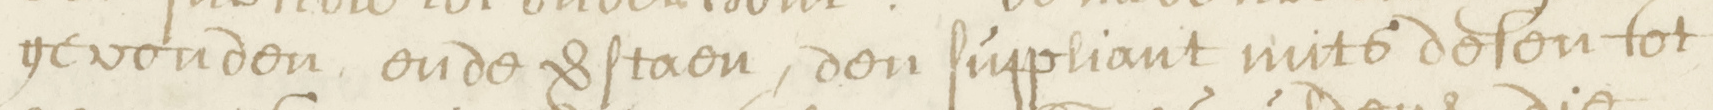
gevonden, ende vstaen, den suppliant mits desen tot
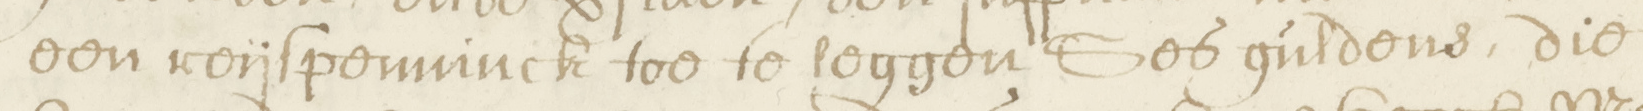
een reijspenninck toe te leggen Ses guldens, die
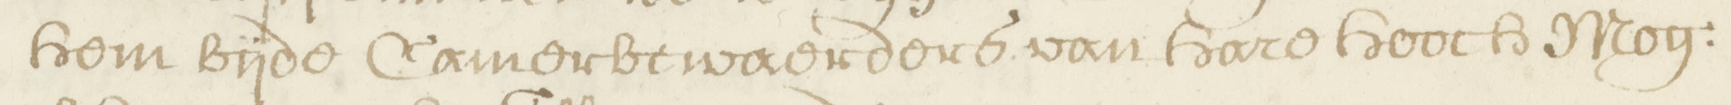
hem bijde Camerbewaerders van hare hooch Mog:
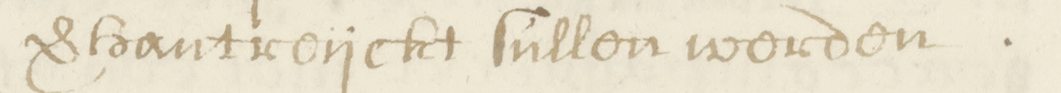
vhantreijckt sullen werden
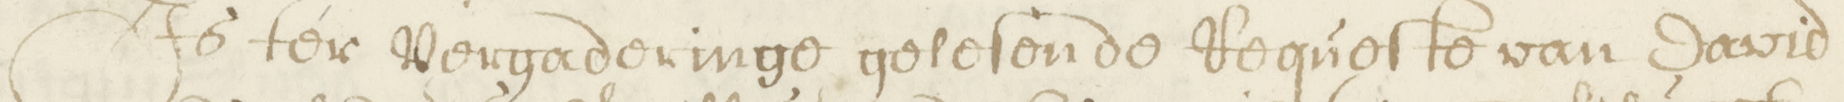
Is ter Vergaderinge gelesende Requeste van David
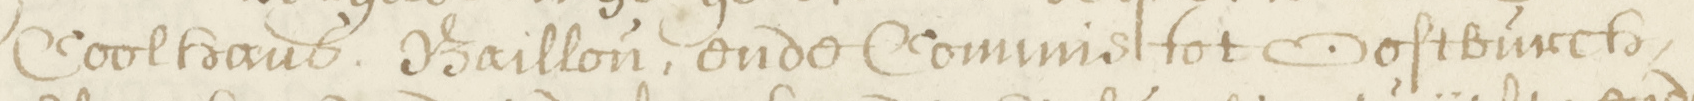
Coolhans, Baillou, ende Commis tot Oostburch,
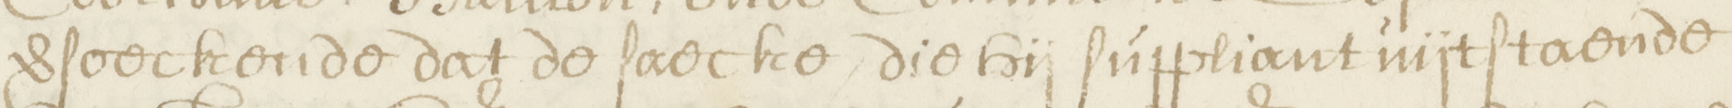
vsoeckende dat de saecke, die hij suppliant uijtstaende
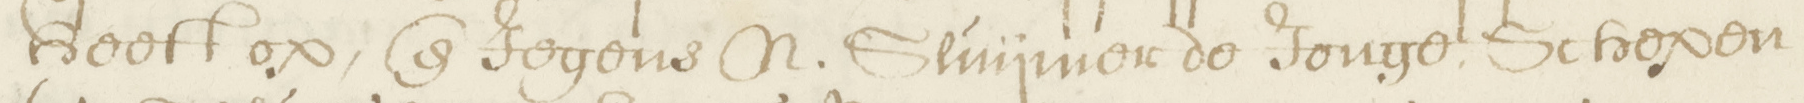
heeft op, & Jegens N. Sluijmer de Jonge Schepen
